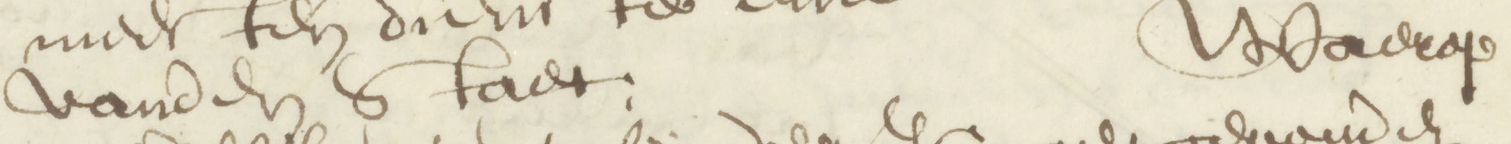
vanden Staet: Waerop
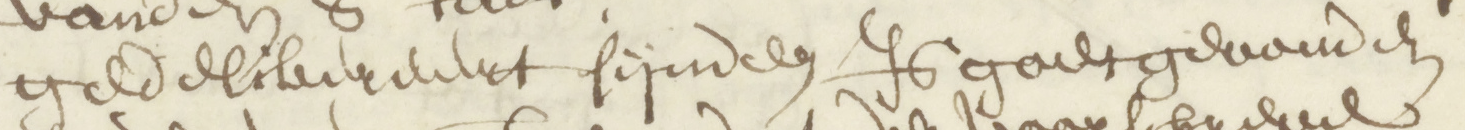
gedelibereert sijnde, Is goetgevonden
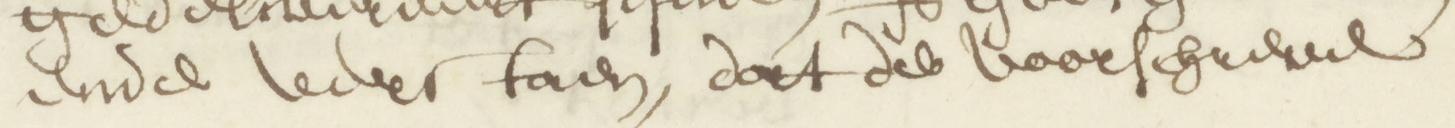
ende verstaen, dat de voorschreve
